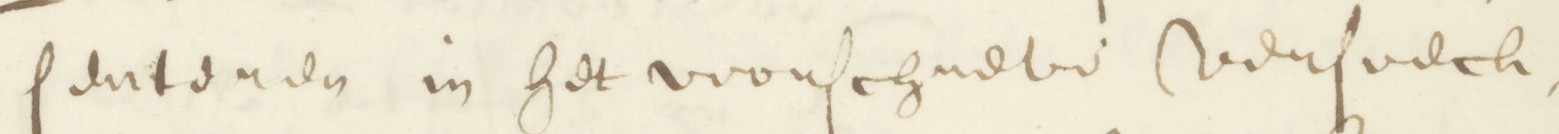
senteren in het voorschreve versoeck
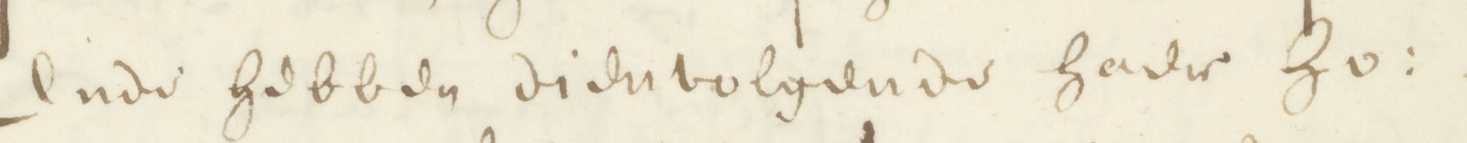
ende hebben dienvolgende haer ho:
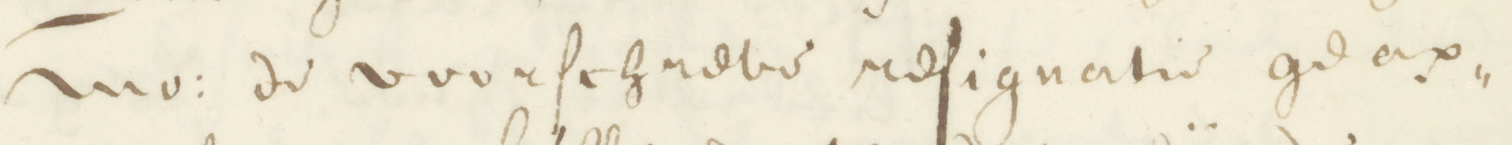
mo: de voorschreve resignatie geap„
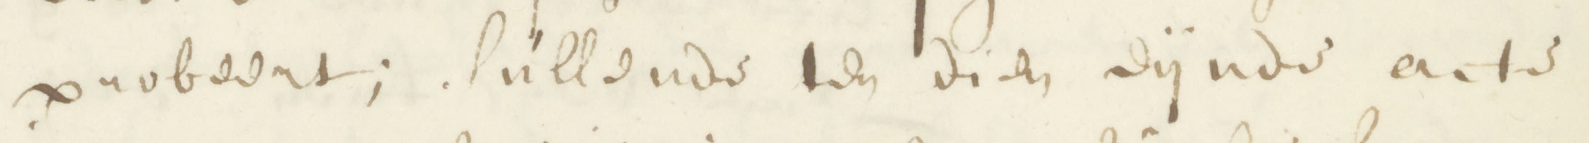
probeert; sullende ten dien eijnde acte
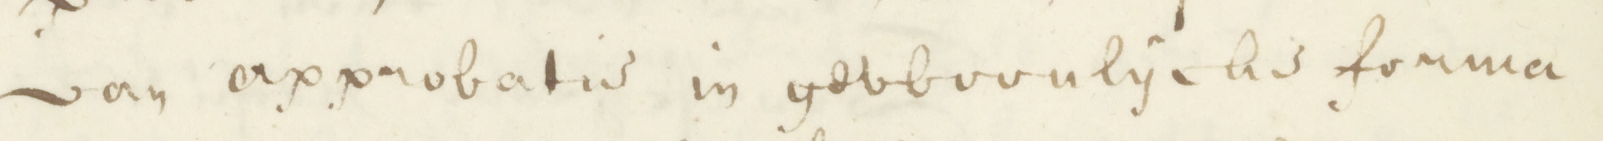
van approbatie in gewoonlijcke forma
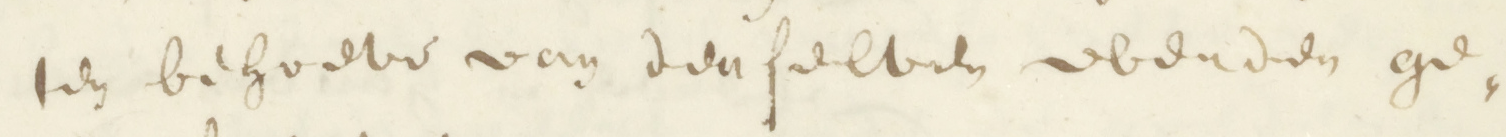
ten behoeve van denselven werden ge„
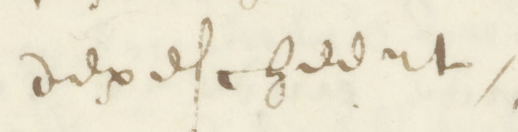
depescheert.
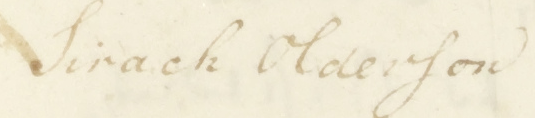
Sirach Olderson
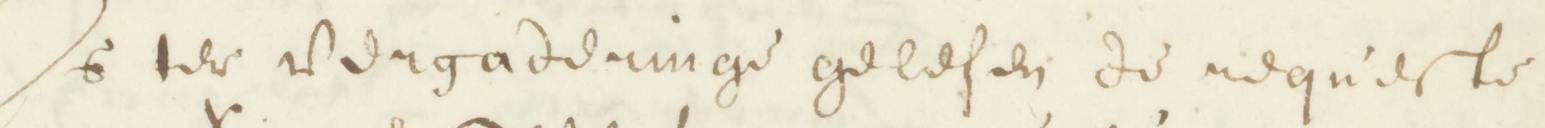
Is ter vergaderinge gelesen de requeste
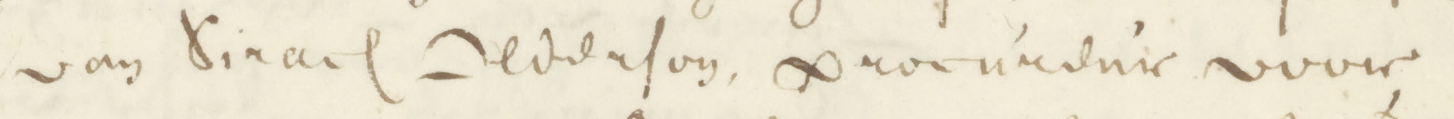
van Sirach Olderson, procureur voor
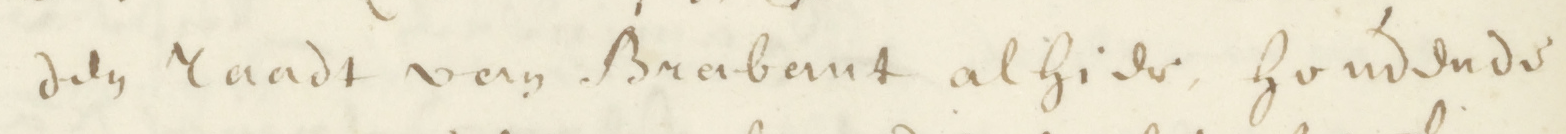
den raadt van Brabant alhier, houdende
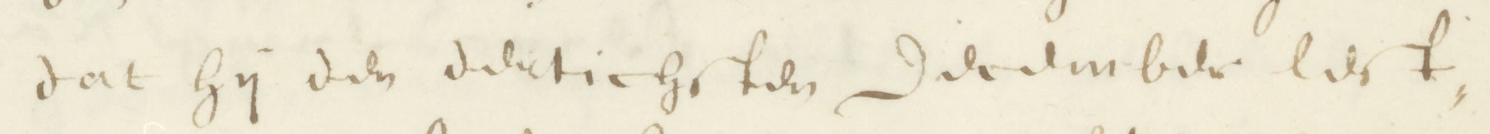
dat hij den dertichsten December lest„
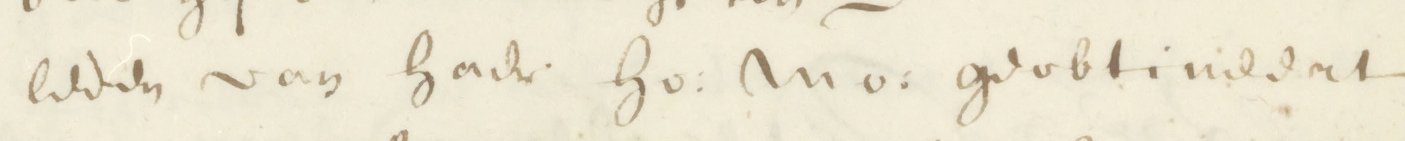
leden van haer ho:mo: geobtineert
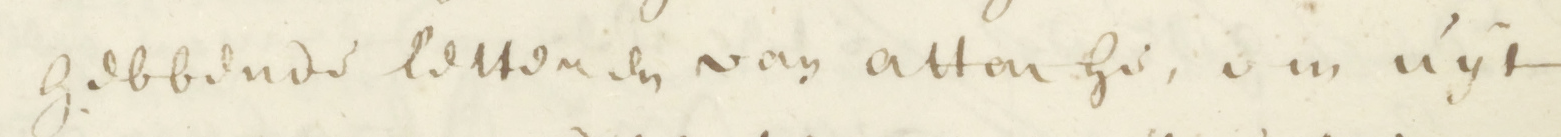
hebbende letteren van attache, om uijt
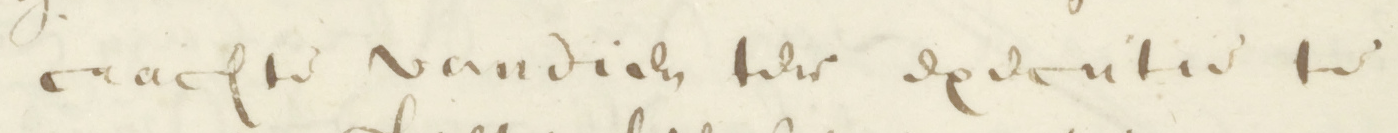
crachte vandien ter executie te
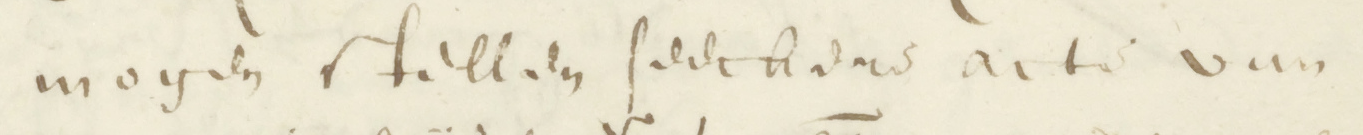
mogen stellen seeckere acte van
